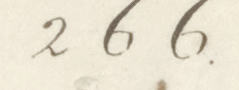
266.
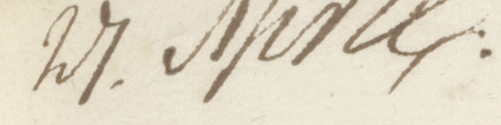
27. April.
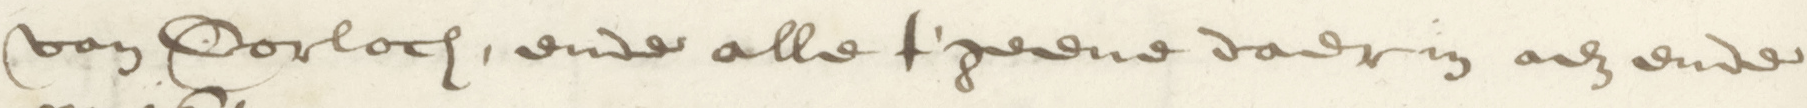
van Oorloch, ende alle t'geene daer in aen ende
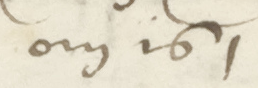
om is.
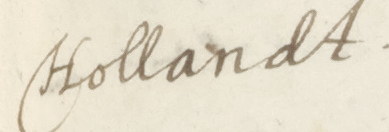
Hollandt
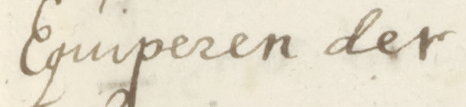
Equiperen der
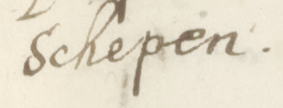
schepen
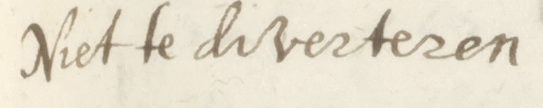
Niet te diverteren
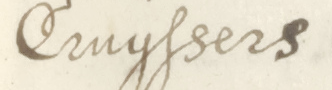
Cruijssers
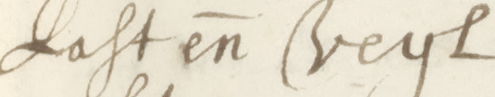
Last end veijl
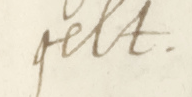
gelt.
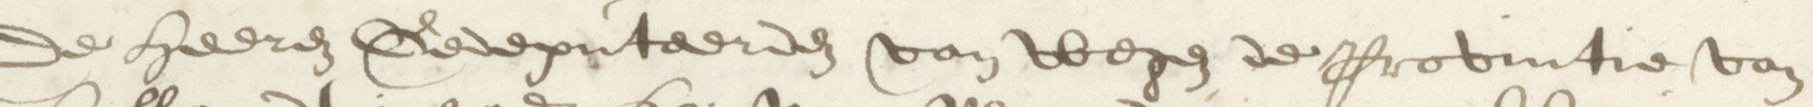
De heeren Gedeputeerden van wegen de Provintie van
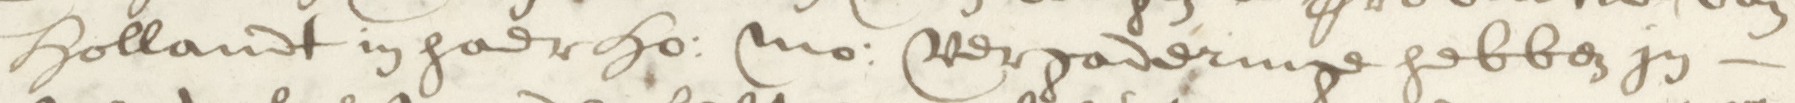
Hollandt in haer Ho:mo: vergaderinge hebben in -
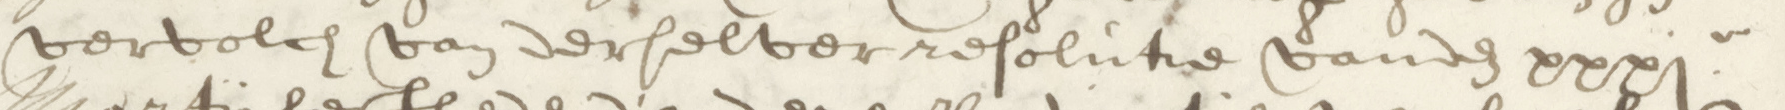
vervolch van derselver resolutie vanden xxxie
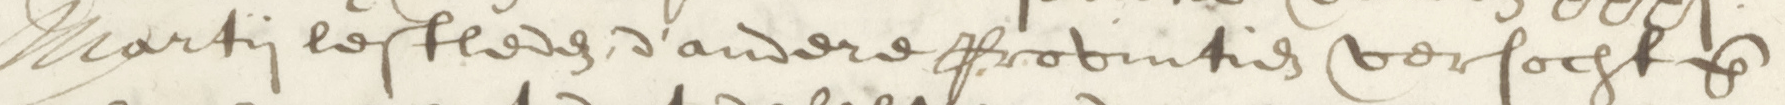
Martij lestleden, d'andere Provintien versocht &
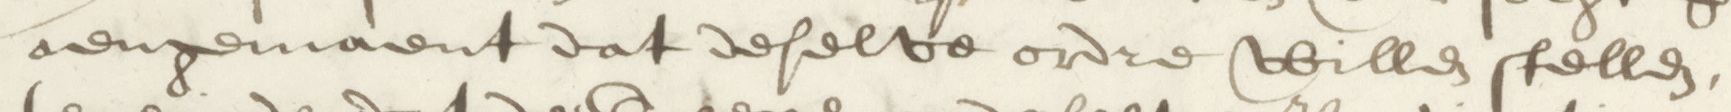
aengemaent dat deselve ordre willen stellen,
